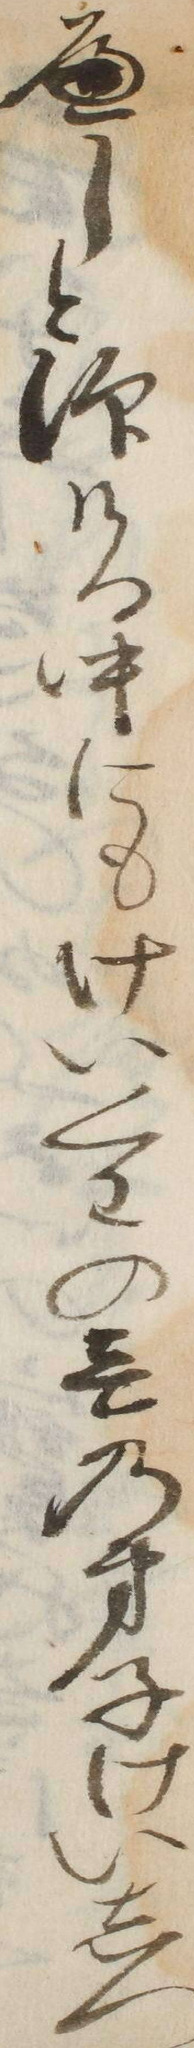べしと仰ける中にもけいくわの壱の弟子けいしつ
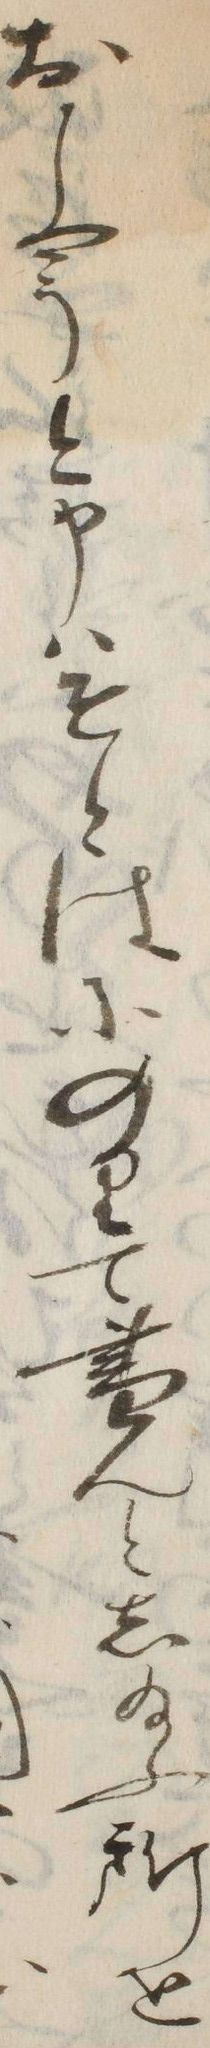おしやうと申はそとはにのりて書んとし給ふ所を
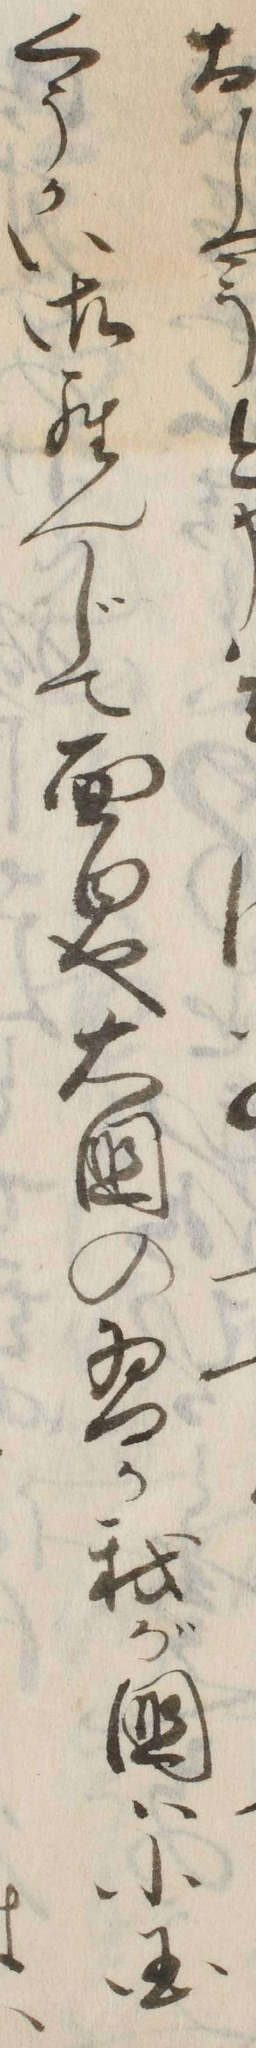くうかい御らんじて面日や大国の習か我が国は小国
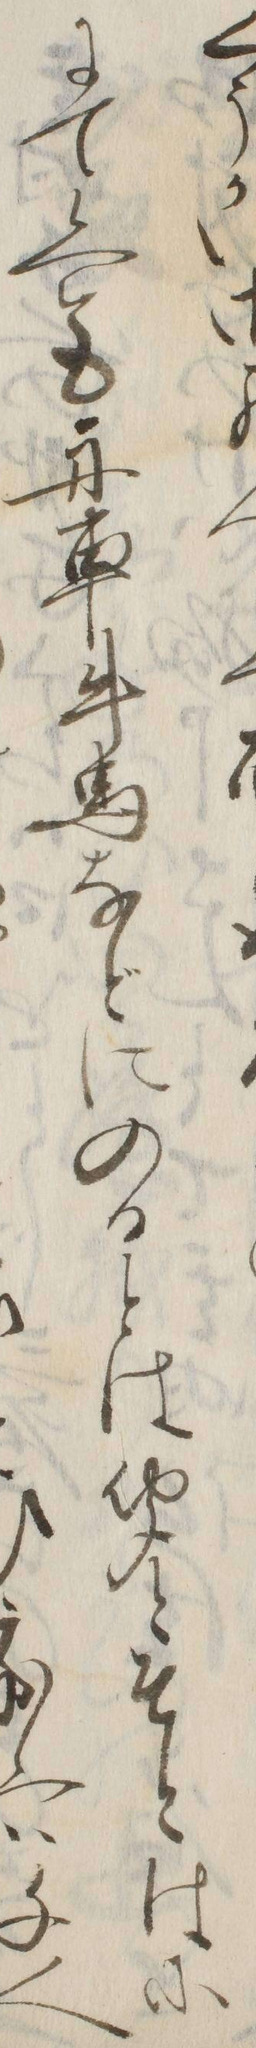にて候へとも舟車牛馬などにのるとは聞とそとはに
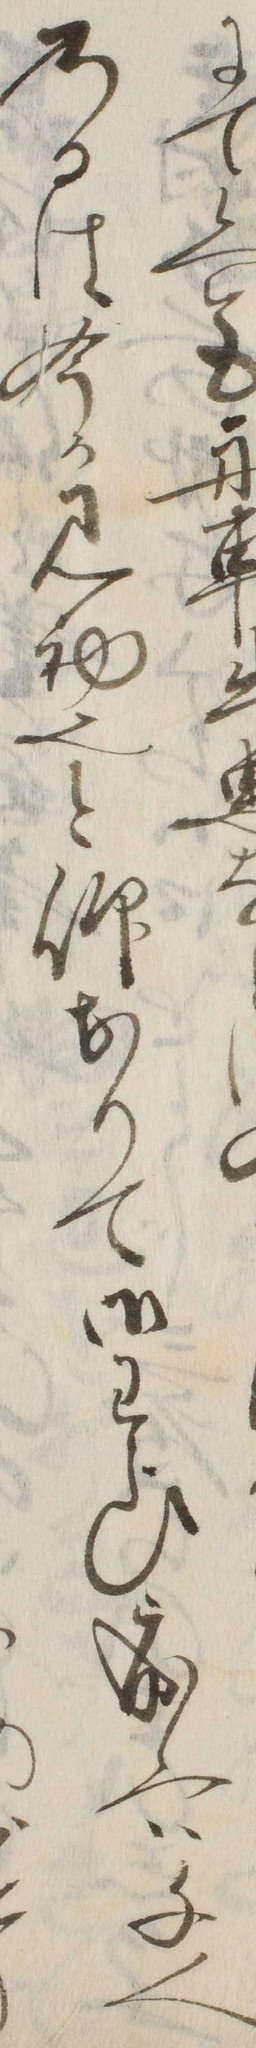のるは今か見初也と仰ありて御わらひ被成候へは千人
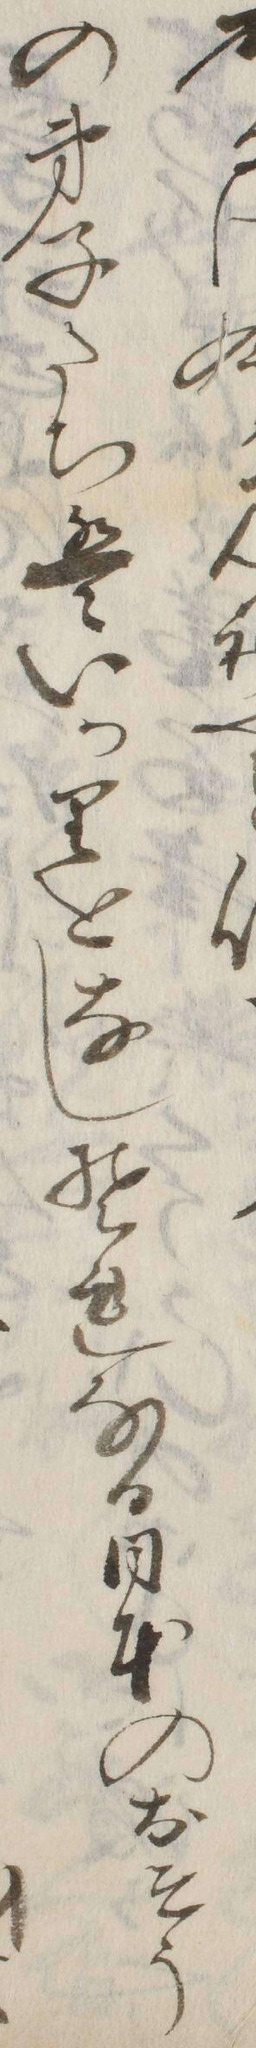の弟子たちはいかりをなしそれなる日本のおそう
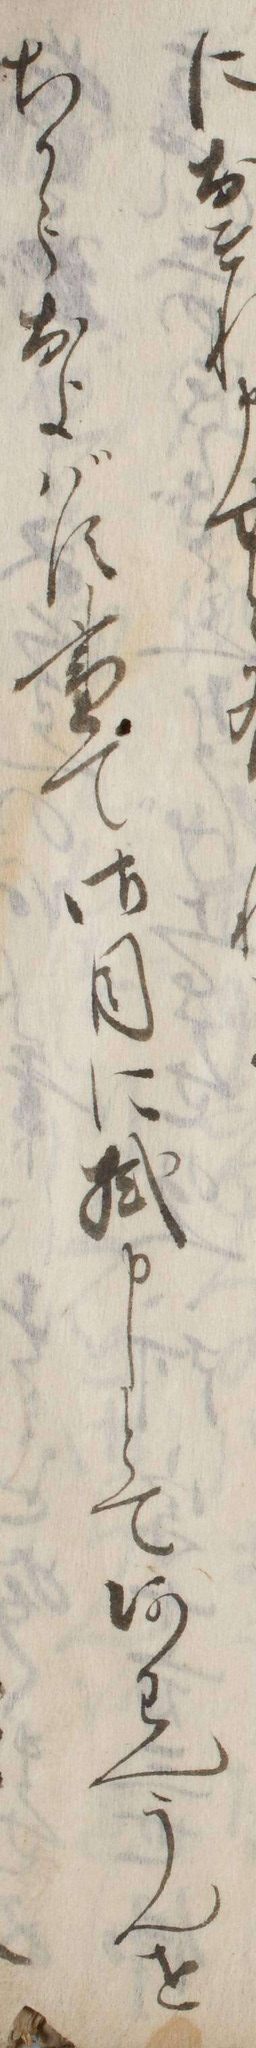ちからおよばす書て御目掛申とてあわんうんを

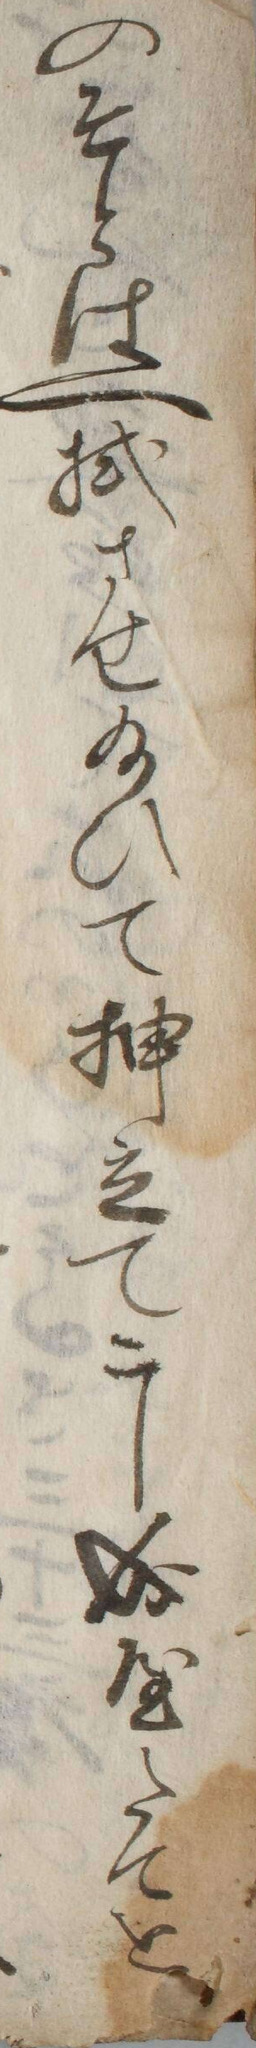のそとはへ掛させ給ひて押立てこし成やたてを
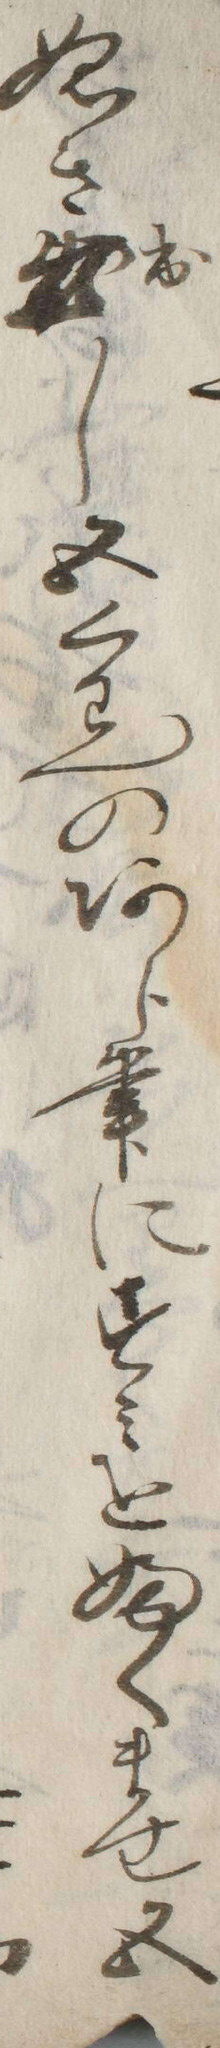ぬき出し五くわんのあら筆にすみをふくませ五
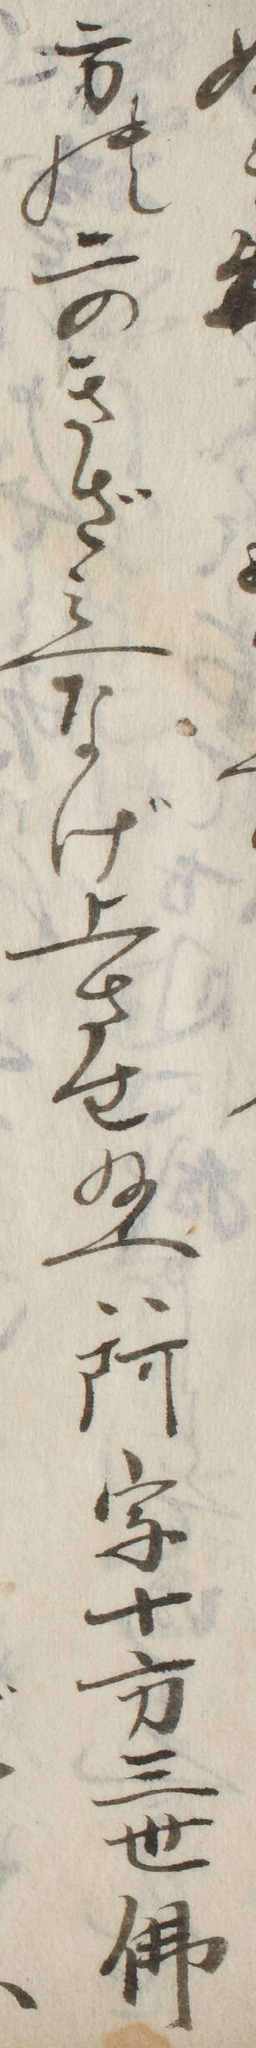方の二のきざみへなげ上させ給へは阿字十方三世仏
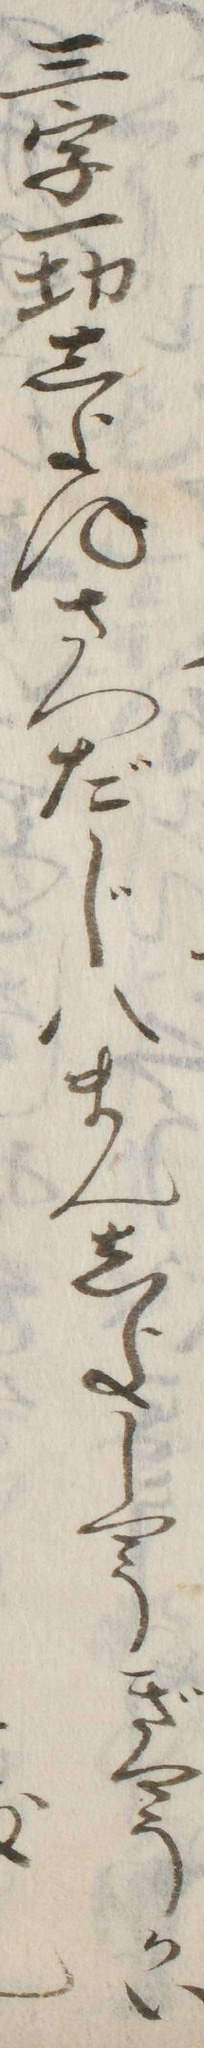三字一切しよほさつだじ八まんしよしやうぎやうかい
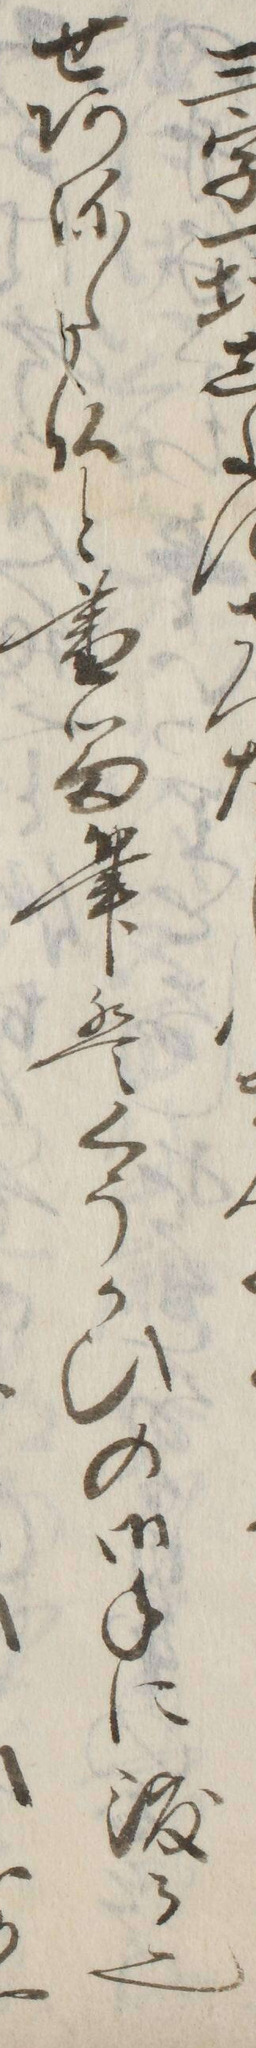せあね？た？仏と書留筆はくうかひの御手に渡る也
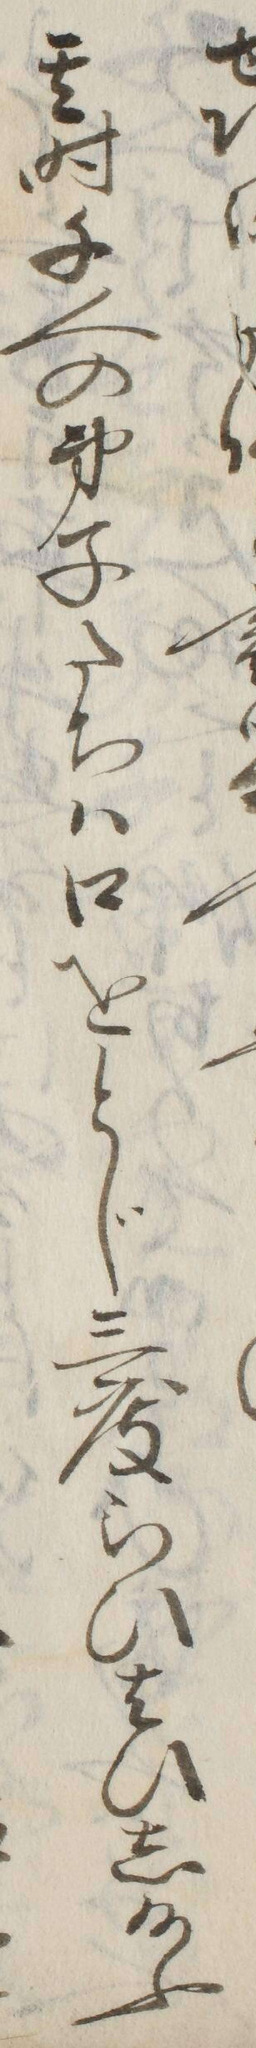其時千人の弟子たちは口をとじ三度らひはひし給ふ
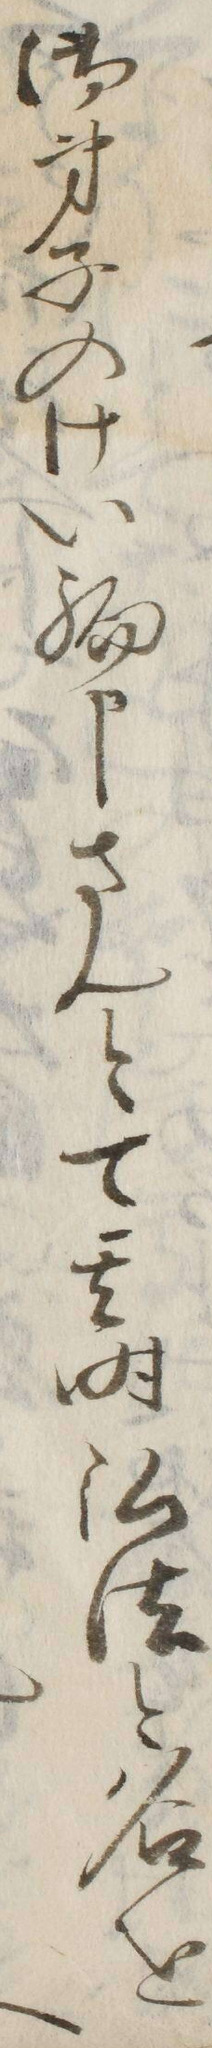御弟子のけい約申さんとて其時弘法と名を
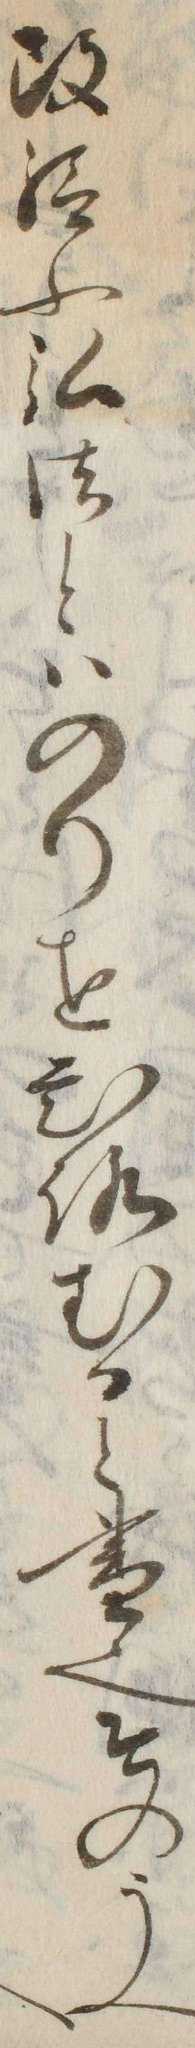改給ふ弘法とはのりをひろむると書也そのうへ
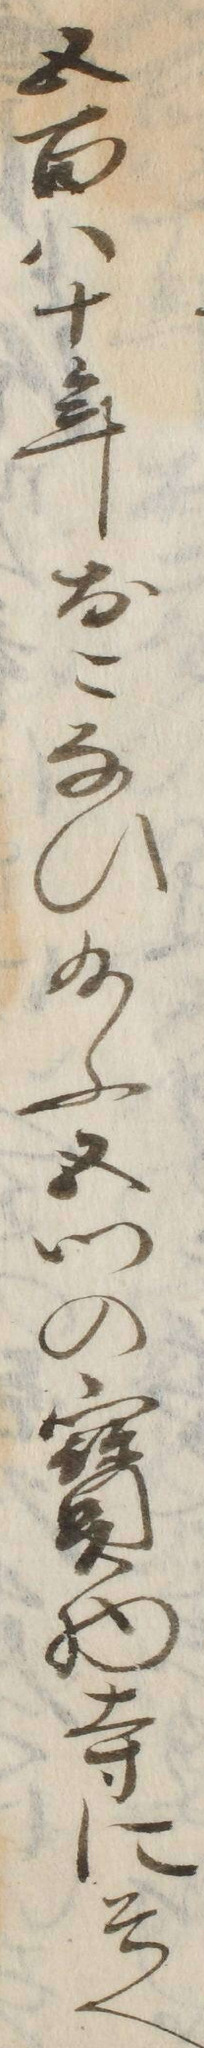五百八十年おこなひ給ふ五つの宝物寺にそへ
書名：奉弘法大師御傳記
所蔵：国文学研究資料館
